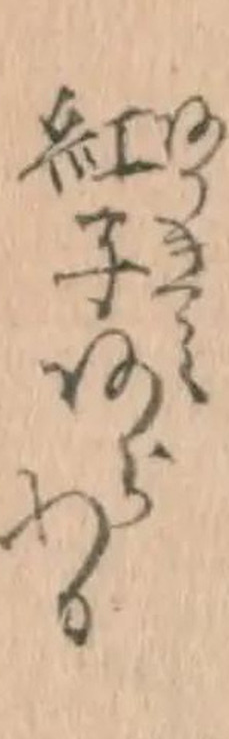紅子あらわる
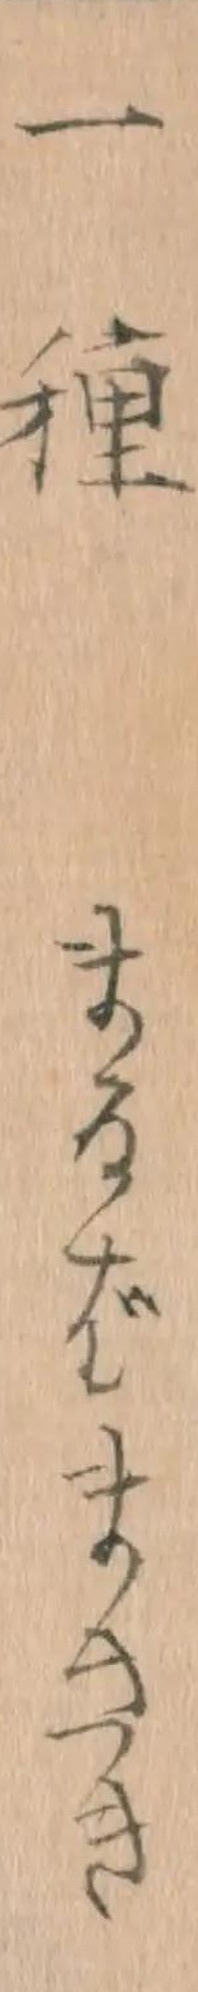一種まるばまさき

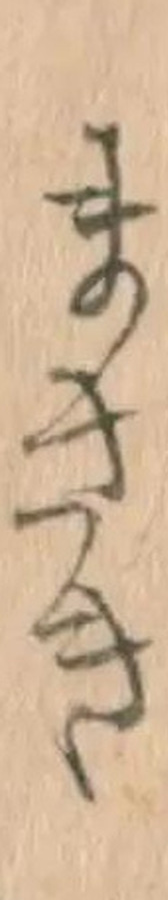まさき

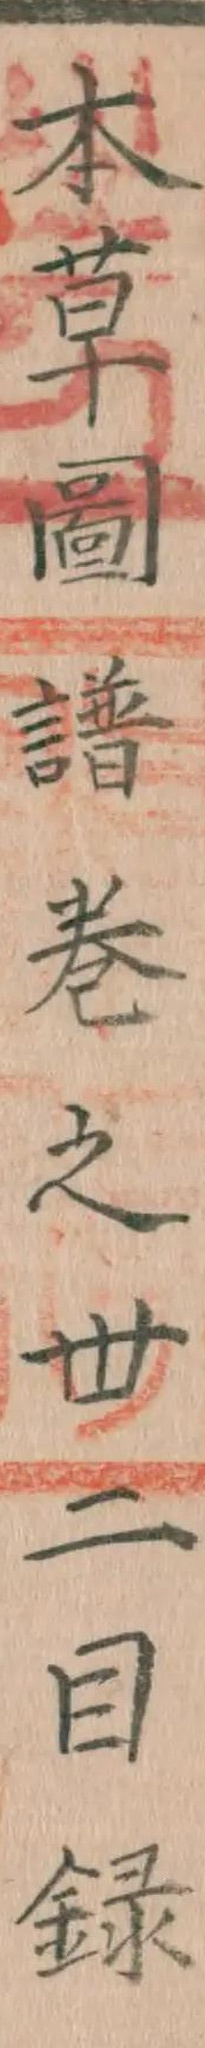本草図譜巻之丗二目録
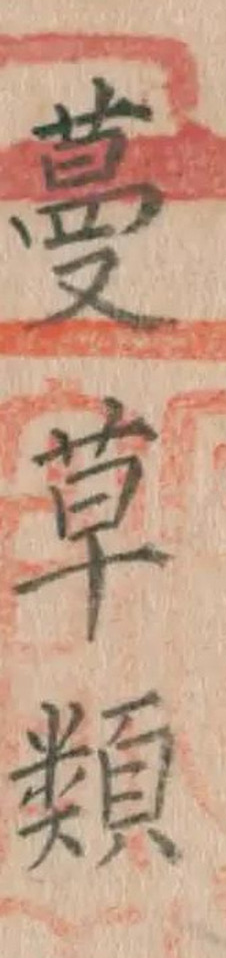蔓草類

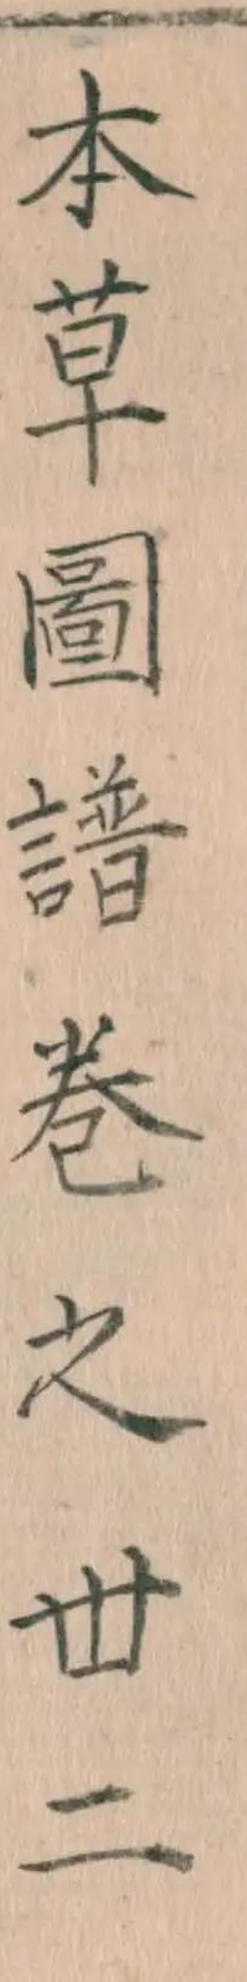本草図譜巻之丗二
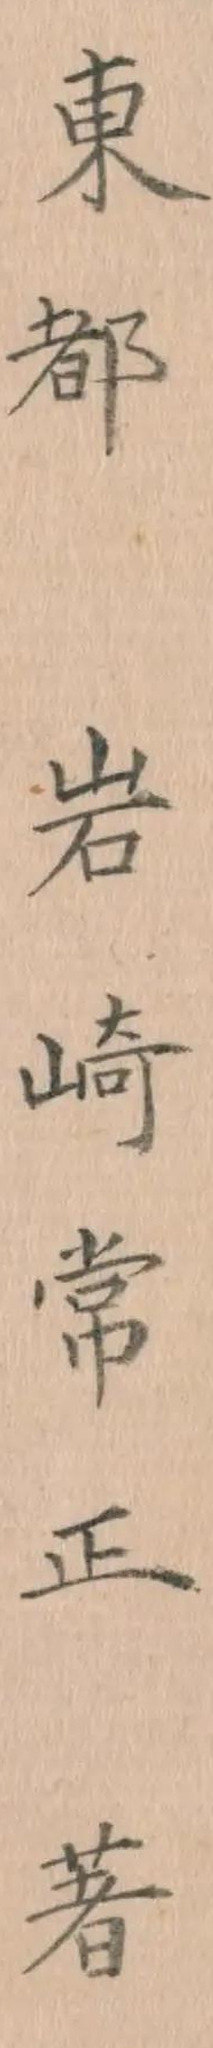東都岩崎常正著
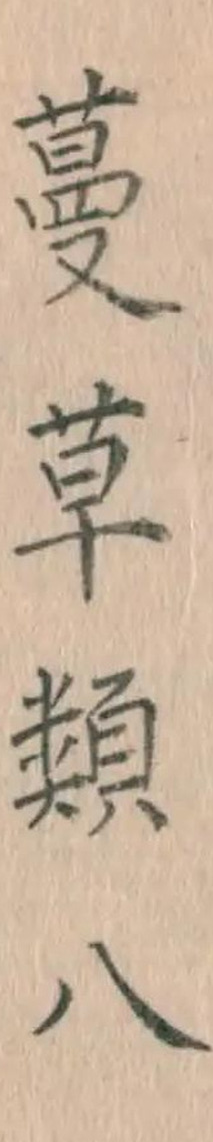蔓草類八
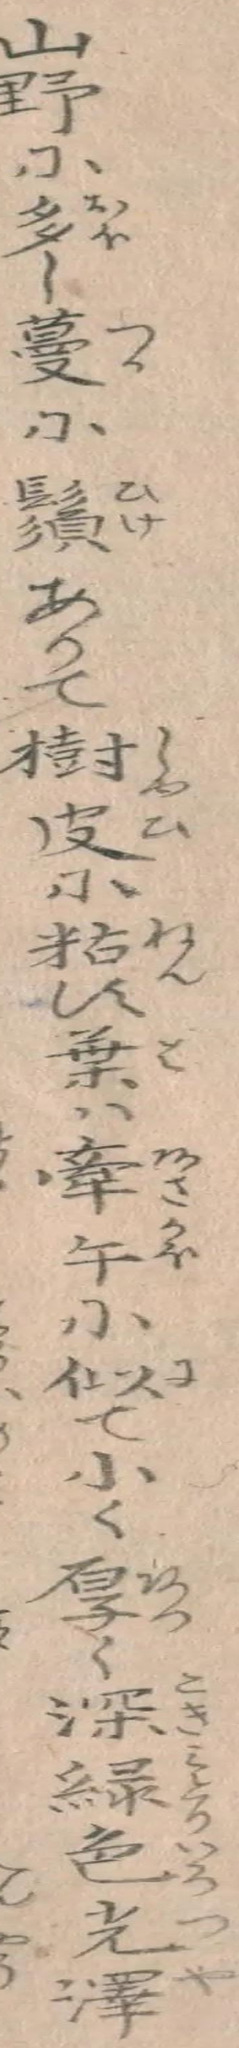山野に多し蔓に鬚ありて樹皮に粘す葉は牽午に似て小く厚く深緑色光沢
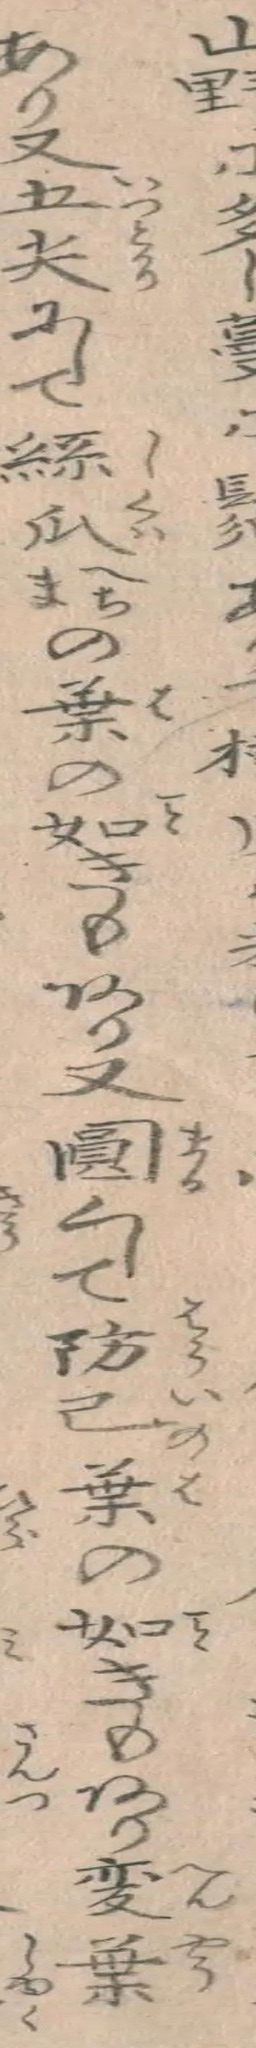あり又五尖にして糸瓜へちまの葉の如きもあり又円くして防己葉の如きもあり変葉
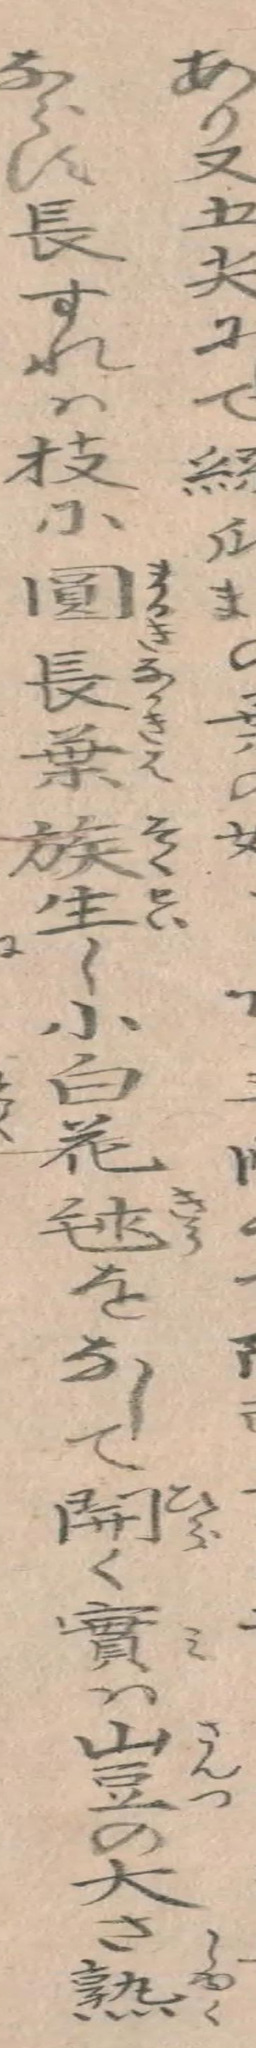ならす長すれは枝に円長葉族生し小白花毬をなして開く実は山豆の大さ熟
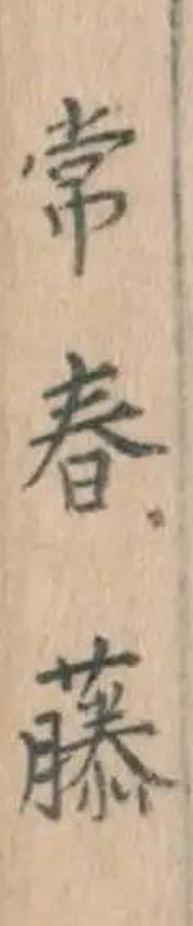常春藤

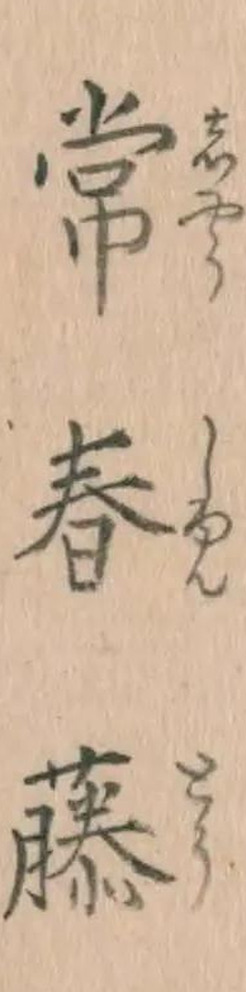常春藤
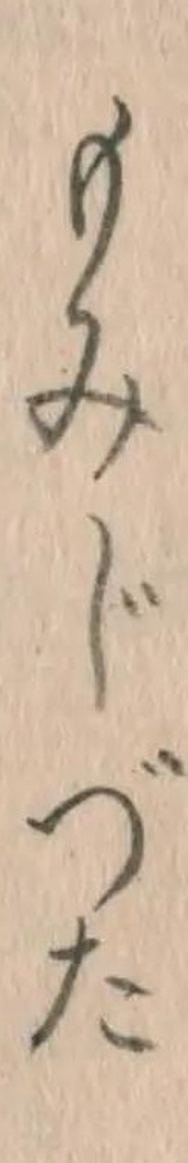もみじづた
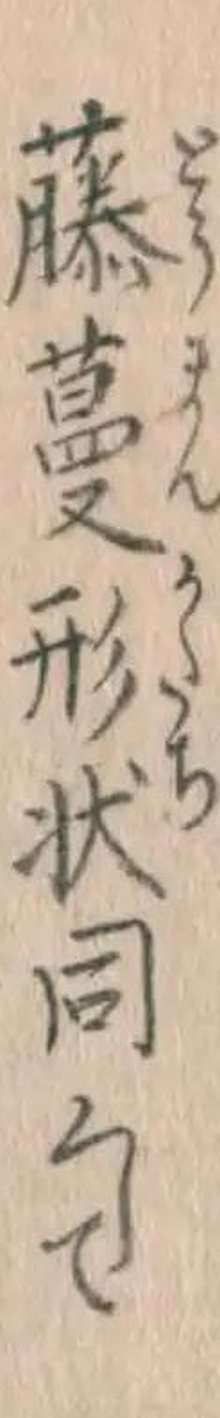藤蔓形状同くして
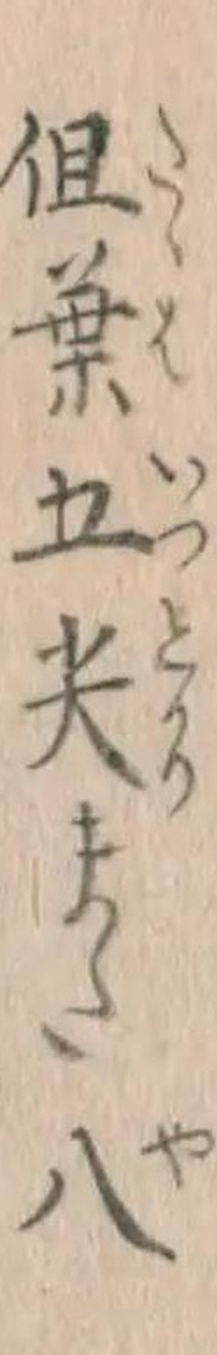但葉五尖また八
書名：本草図譜. 巻31-33
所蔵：国立国会図書館 National Diet Library, JAPAN
